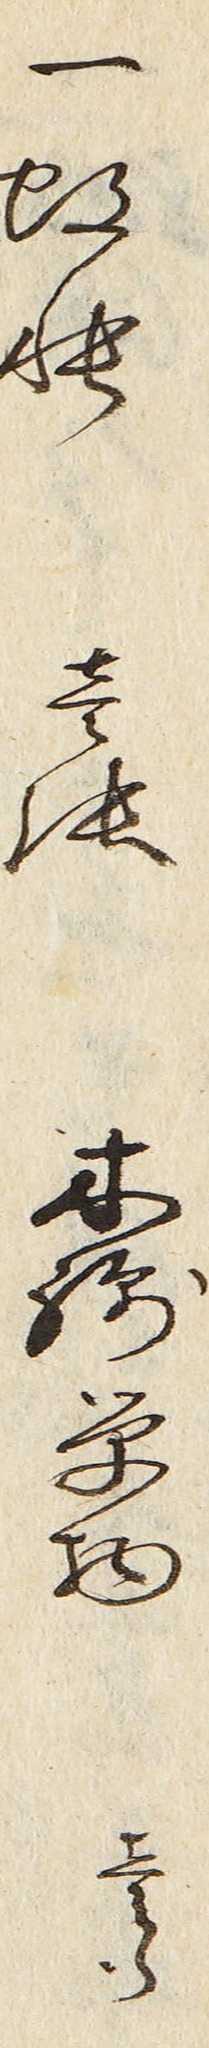一蚊帳壱張木綿単物壱ツ
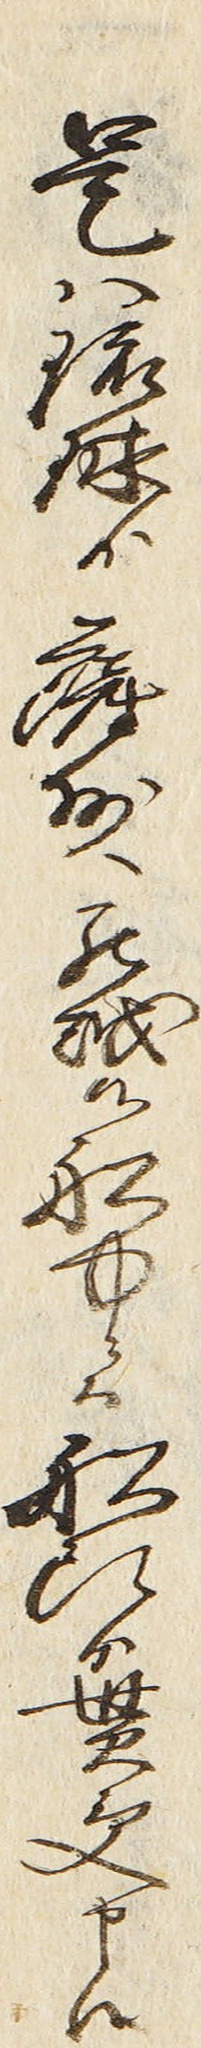是は琉球ゟ薩州へ罷越候船中に而船頭ゟ貰受申候
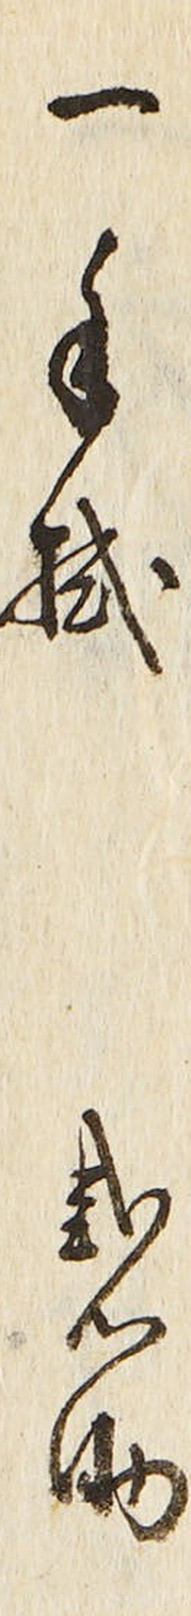一手拭弐筋
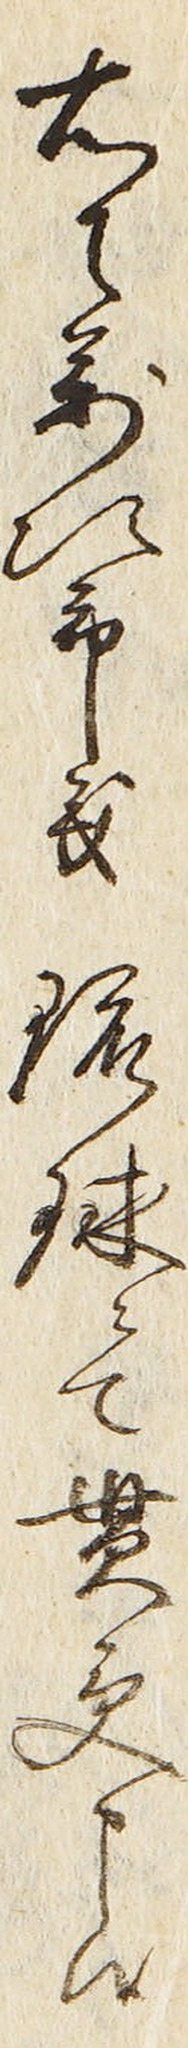右は万次郎義琉球にて貰受申候
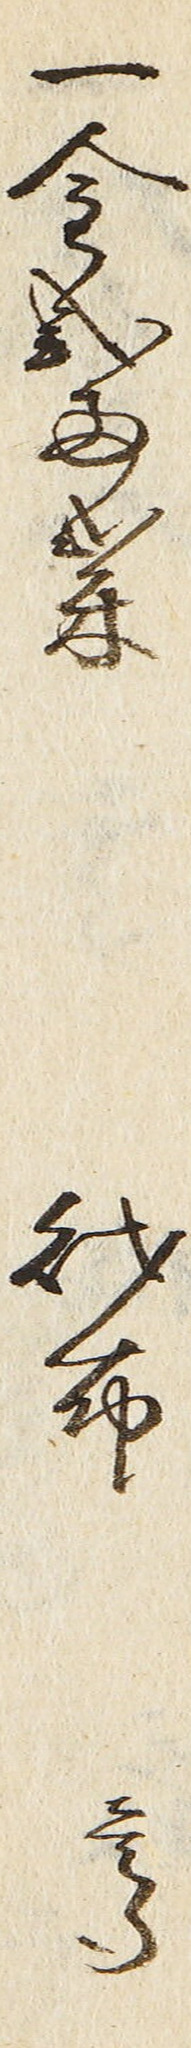一金弐両弐朱財布壱ツ
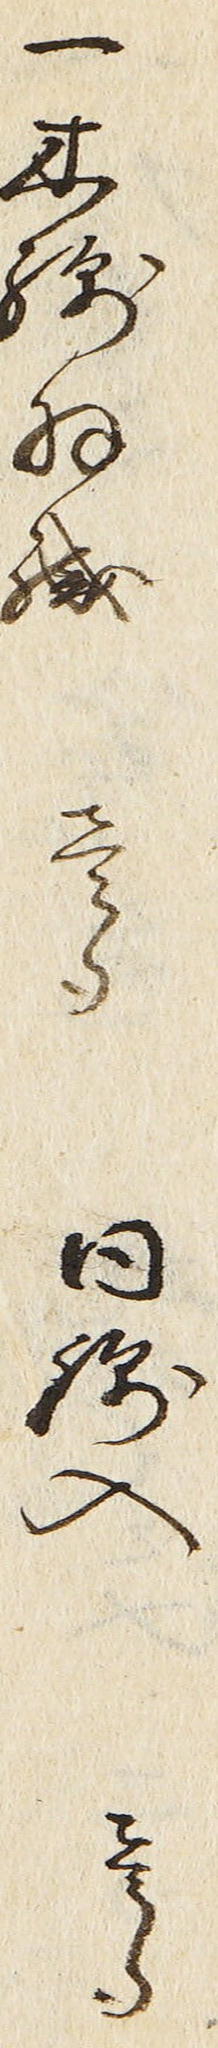一木綿羽織壱ツ同綿入壱ツ
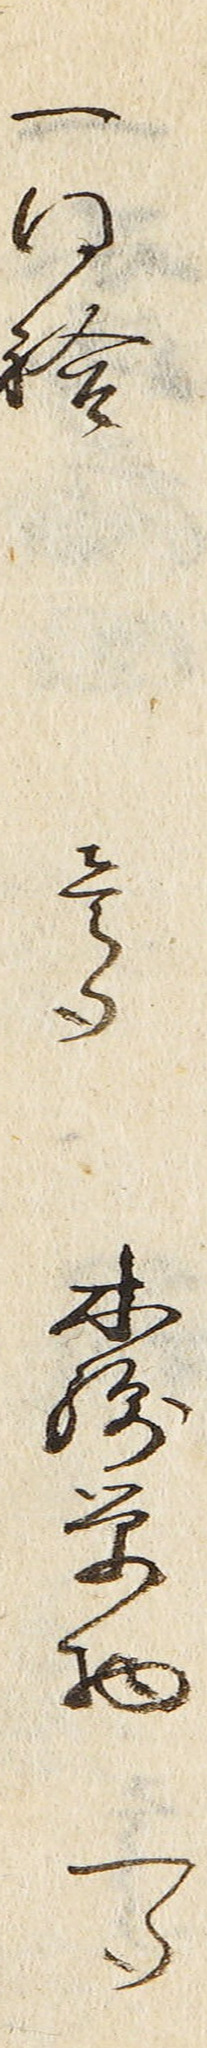一同袷壱ツ木綿単物一ツ
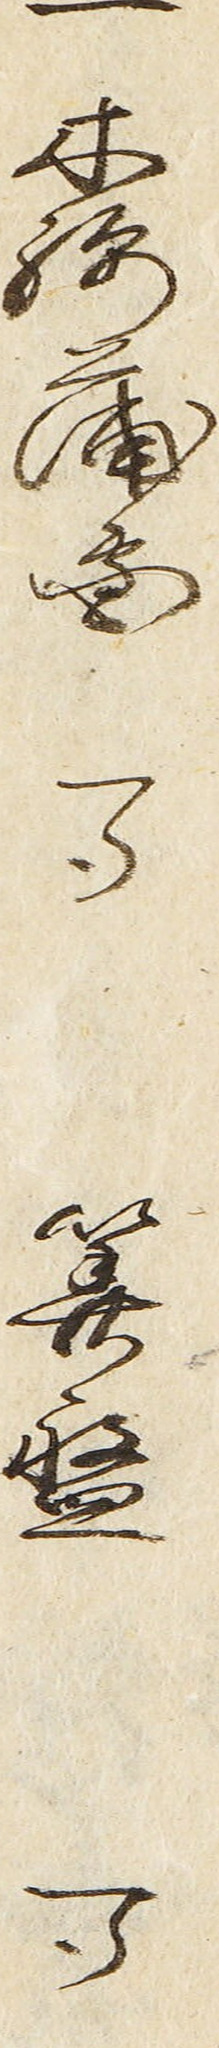一木綿蒲団一ツ算盤一ツ
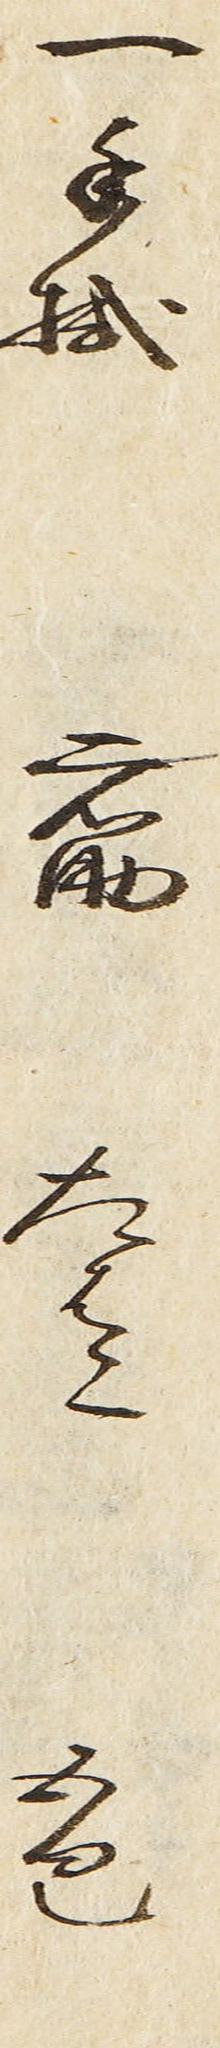一手拭二筋たはこ五包
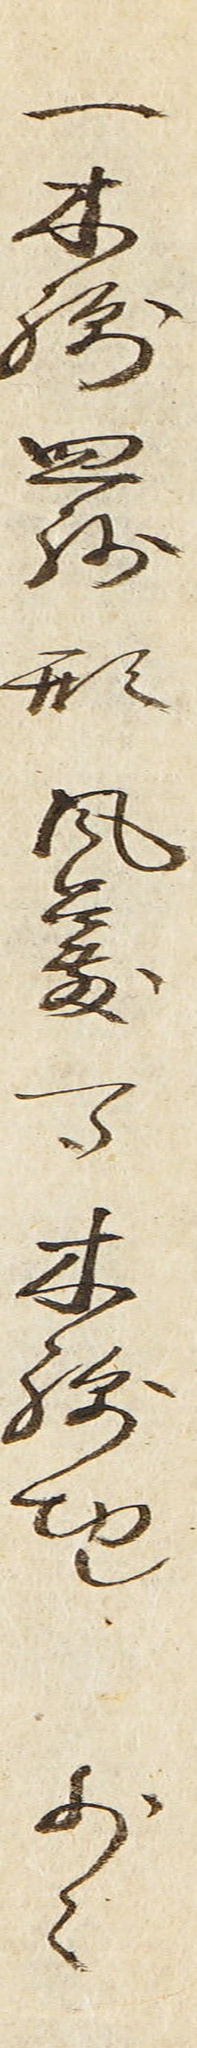一木綿更紗形風呂敷一ツ木綿切れ少々
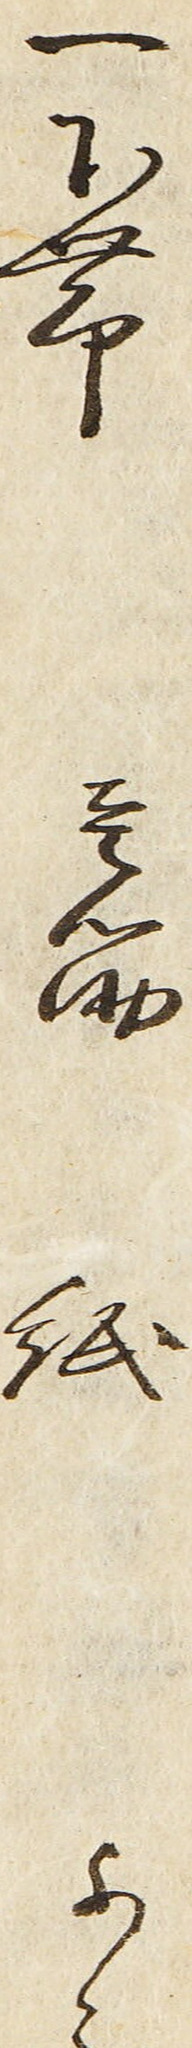一下帯壱筋紙少々
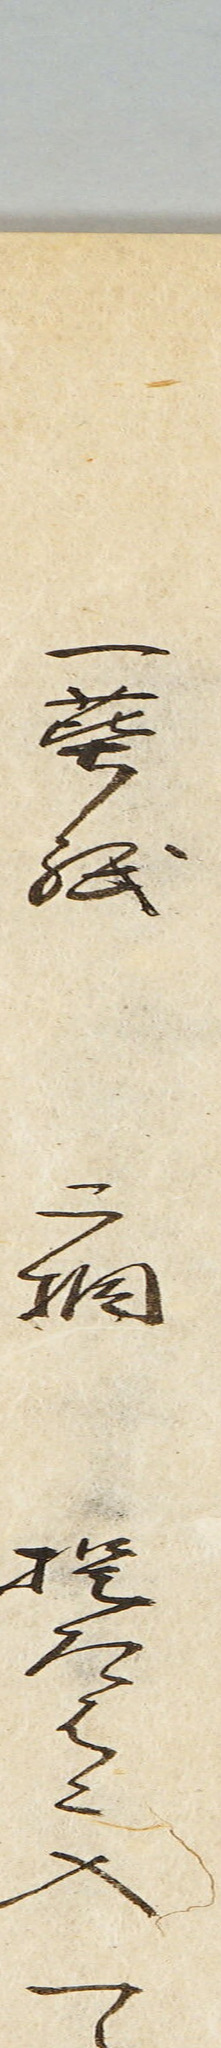一塵紙二掴提たはこ入一ツ
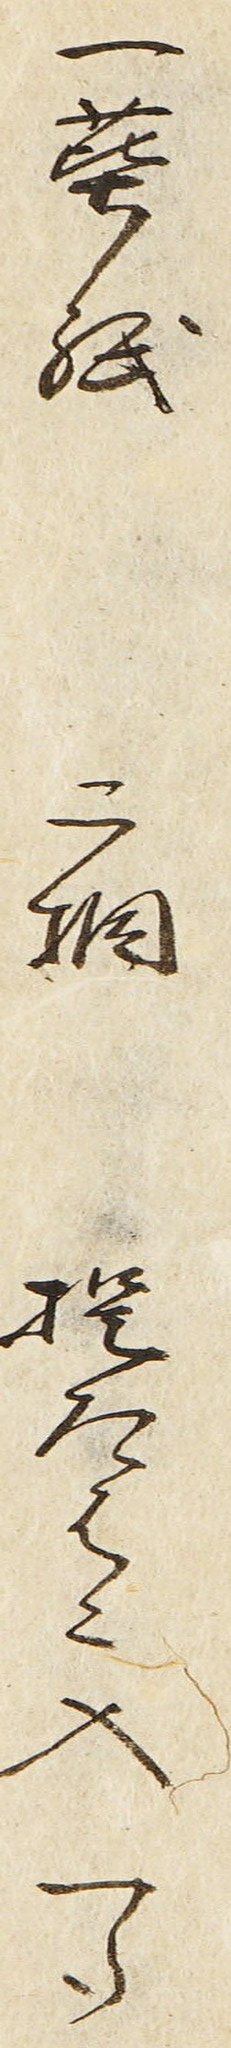一塵紙二掴提たはこ入一ツ

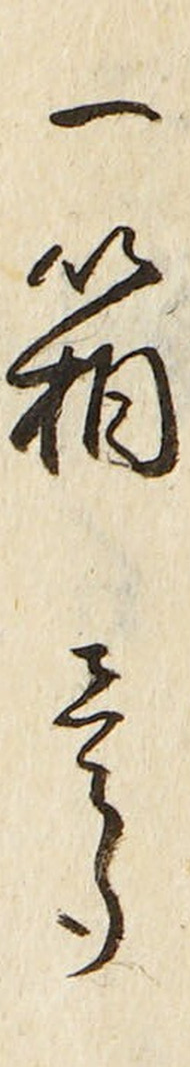一箱壱ツ
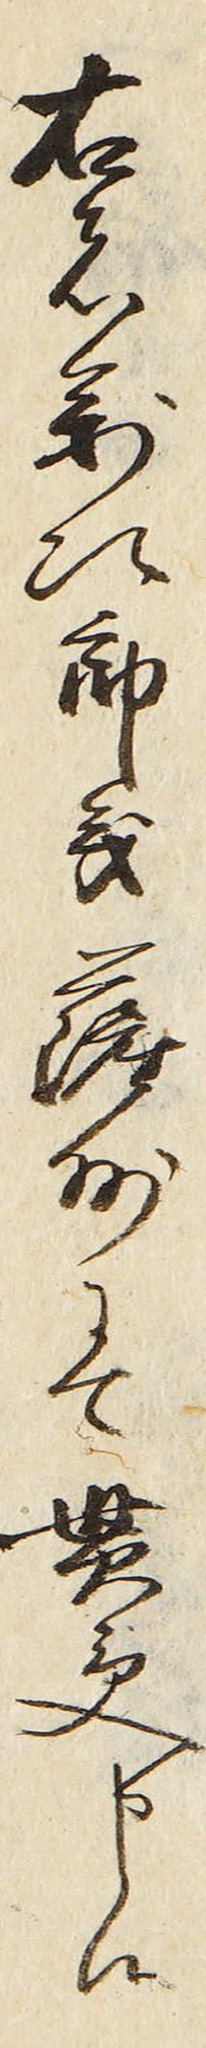右は万次郎義薩摩州にて貰受申候
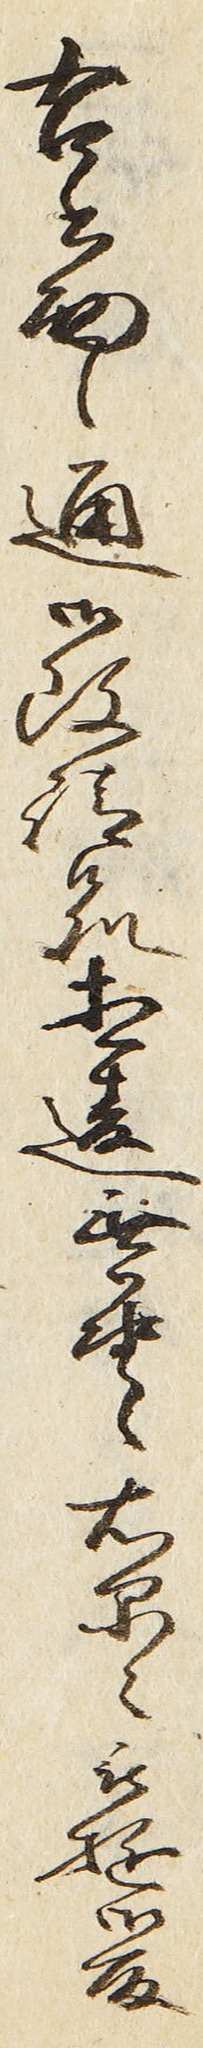右書面之通御改請候処相違無御坐候右品々被遊御取
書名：土佐中浜万次郎漂流記
